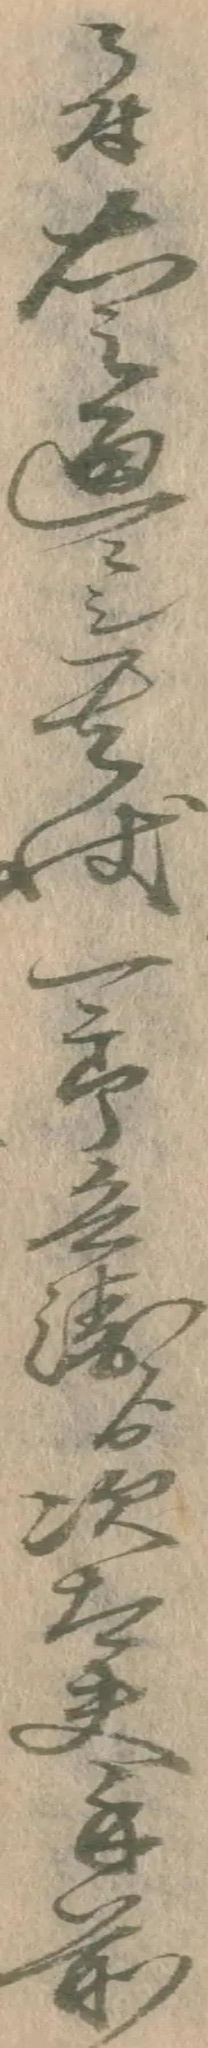に付右之通にし其状一郎兵衛ゟ次太夫手前
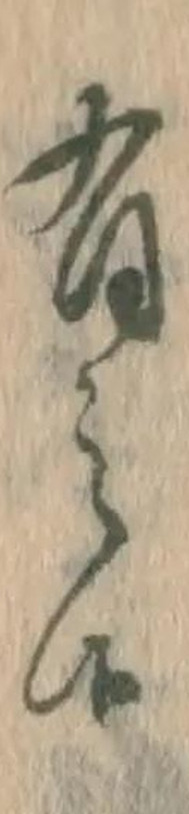有之候
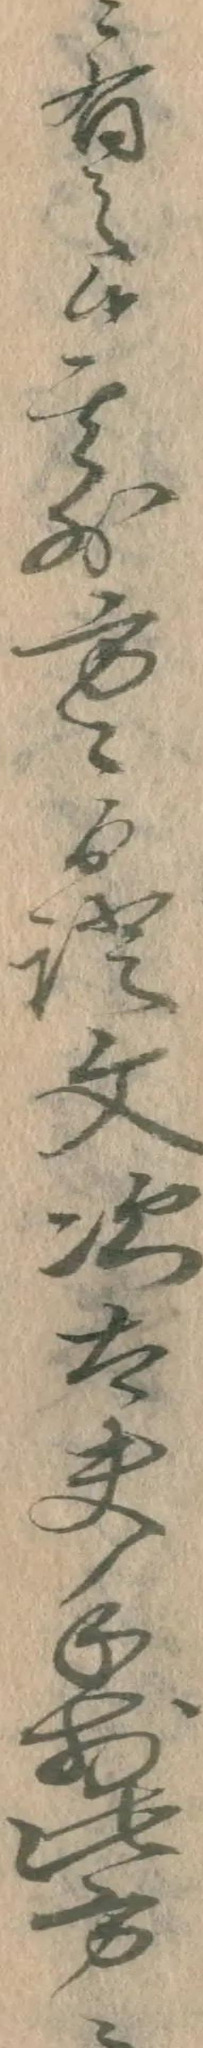に有之候其外方々ゟ證文次太夫手前此方に
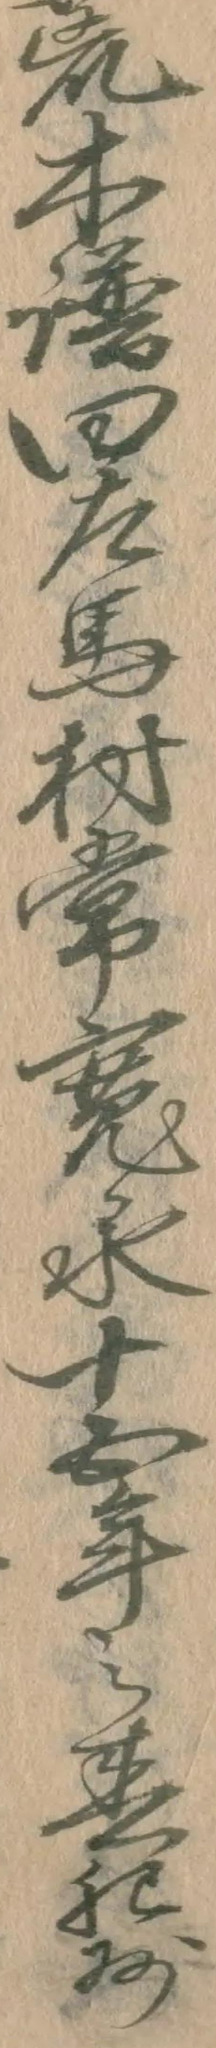荒木譜曰左馬村常寛永十五年之春肥州
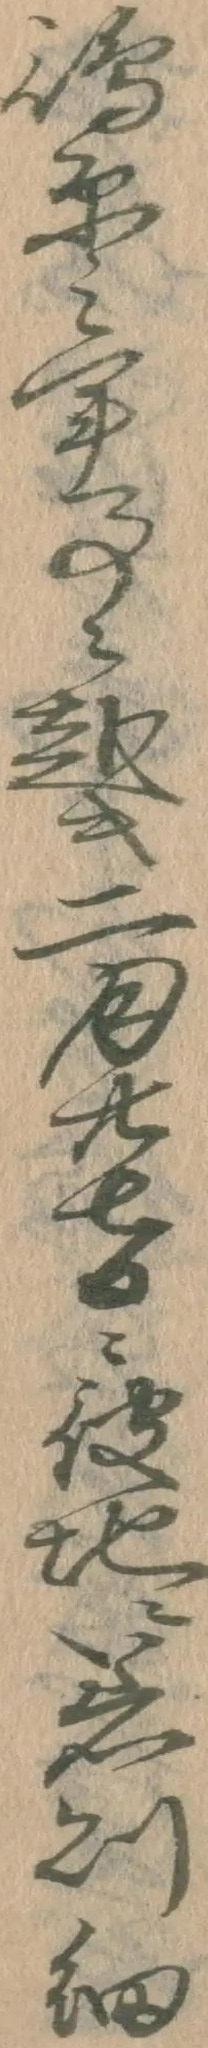島原に軍事に赴き二月廿七日に彼地に着則細
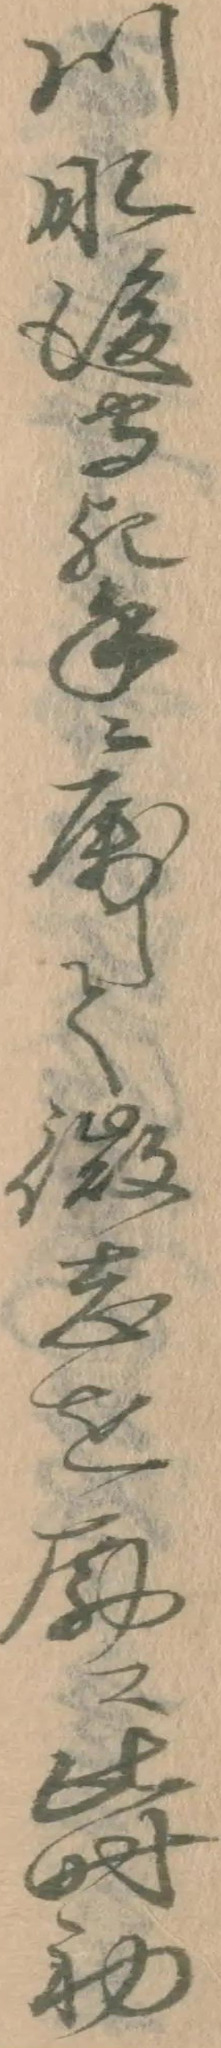川肥後守歟手に属して微志を励す此時初
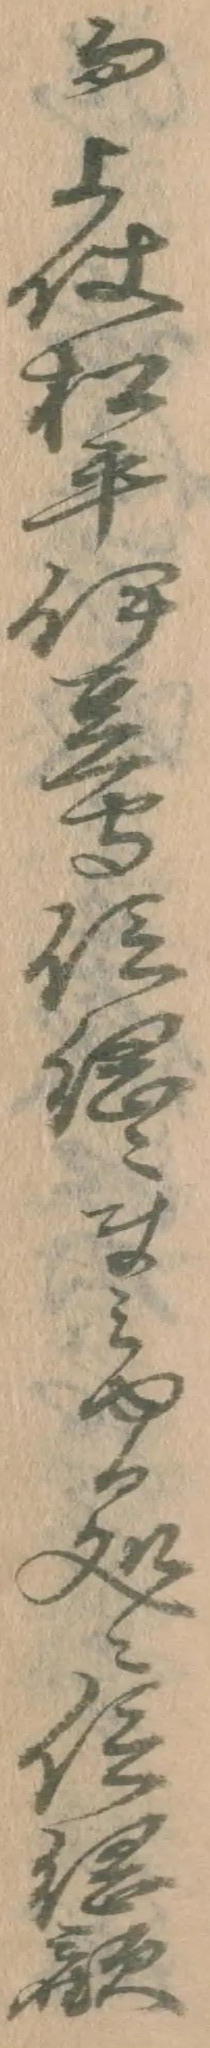而上使松平伊豆守信綱にまみゆる処に信綱敵
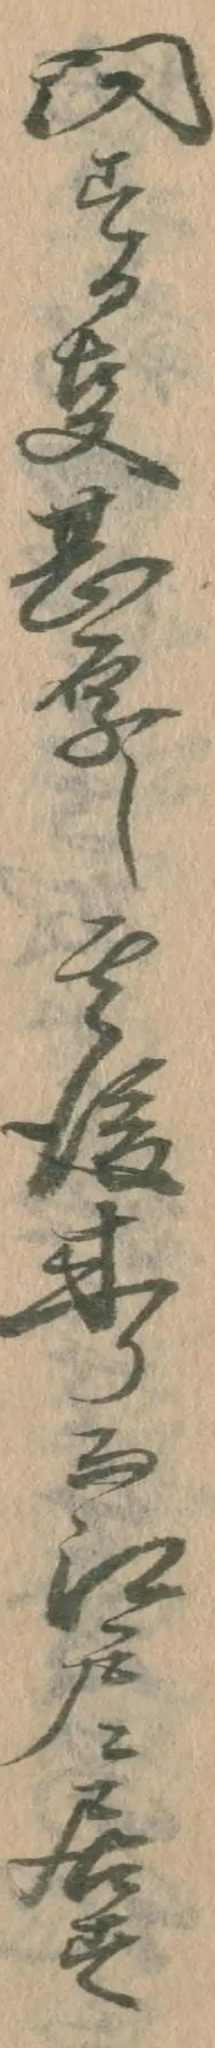問春る事甚厚し其後来り而江戸に居春
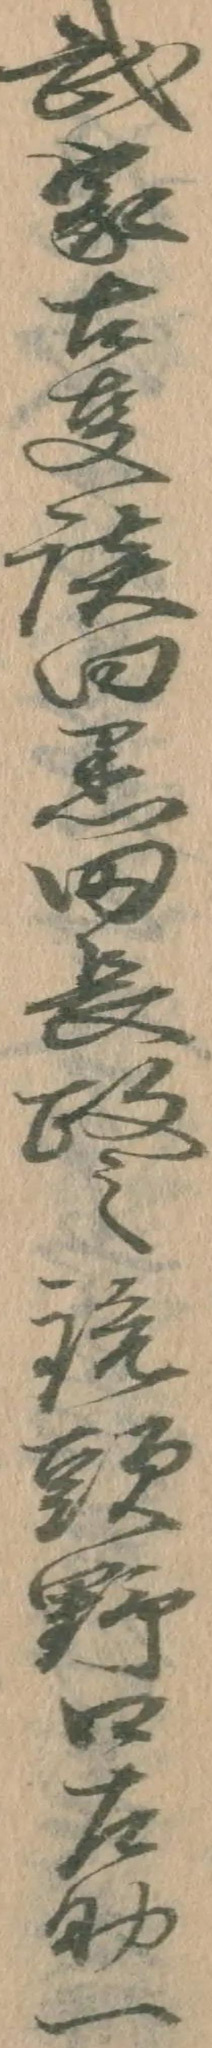武家古事談曰黒田長政之鑓頭野口左助一
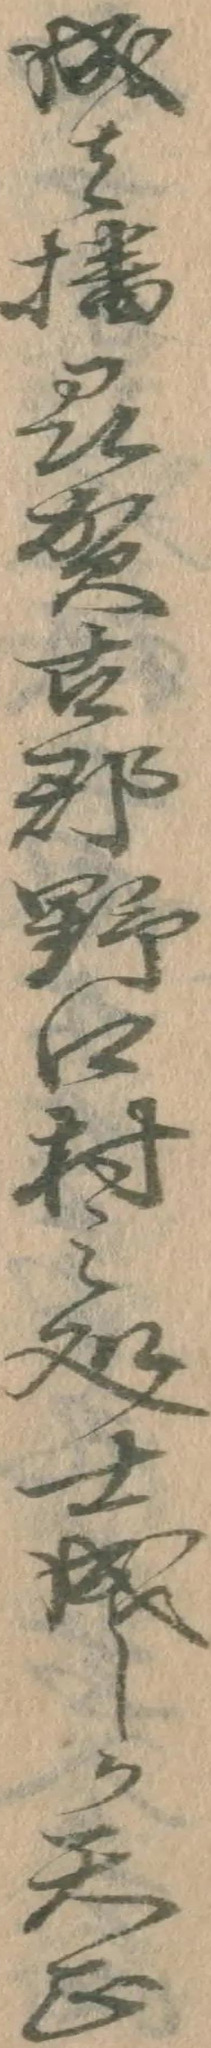成者播州賀古郡野口村之処士成しか天正
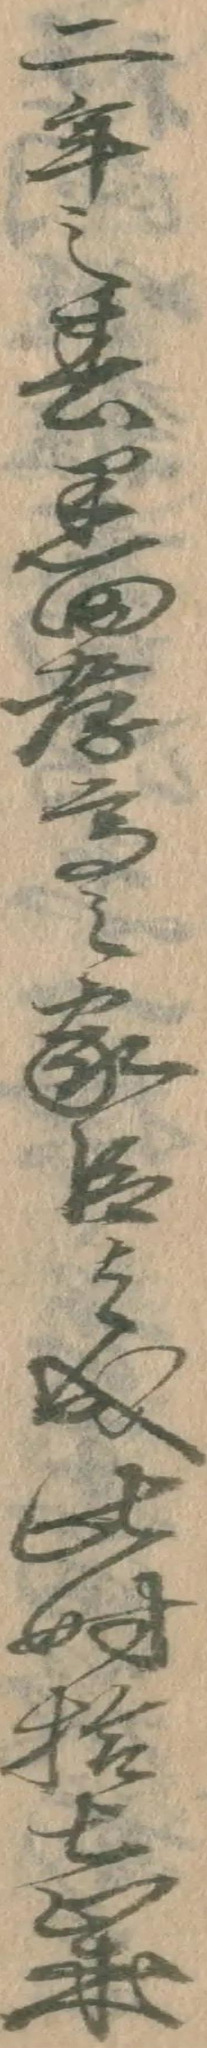二年之春黒田孝高之家臣与成此時拾七歳
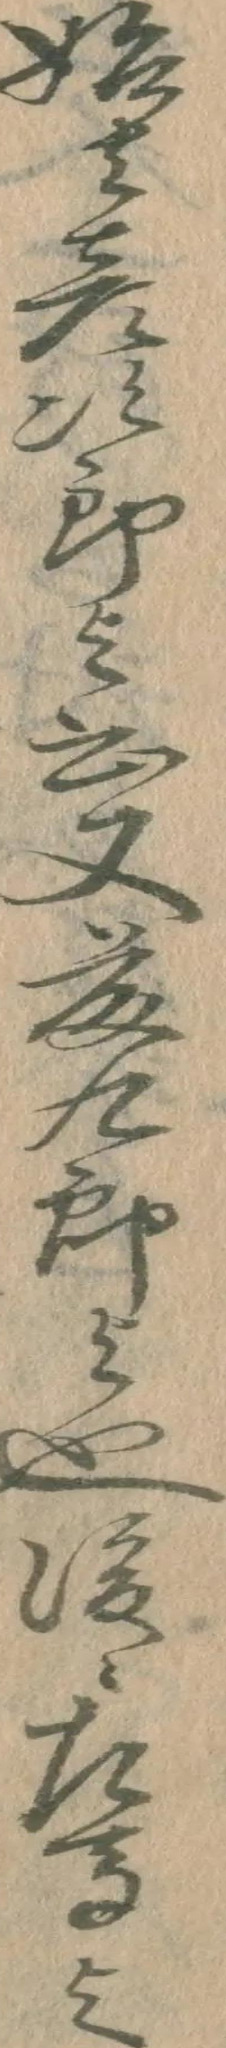始者彦四郎与云又藤九郎与也後に左馬与
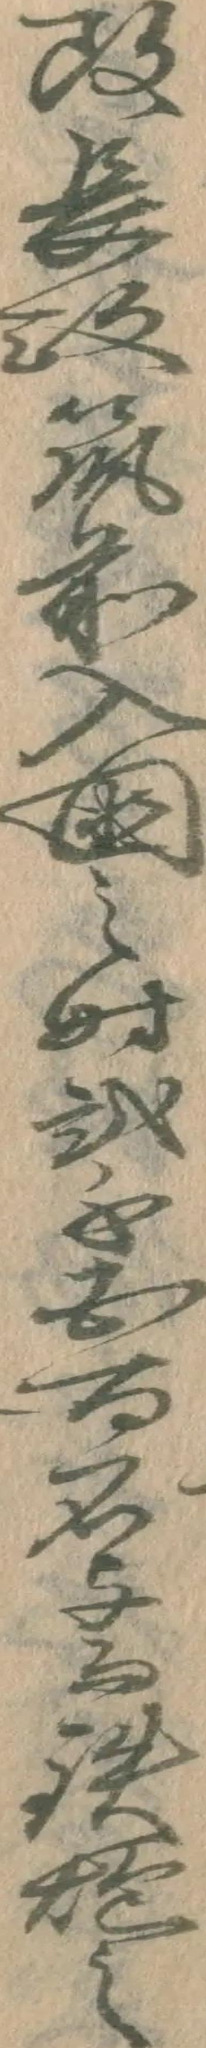改長政筑前入国之時弐千五百石与而鉄砲之
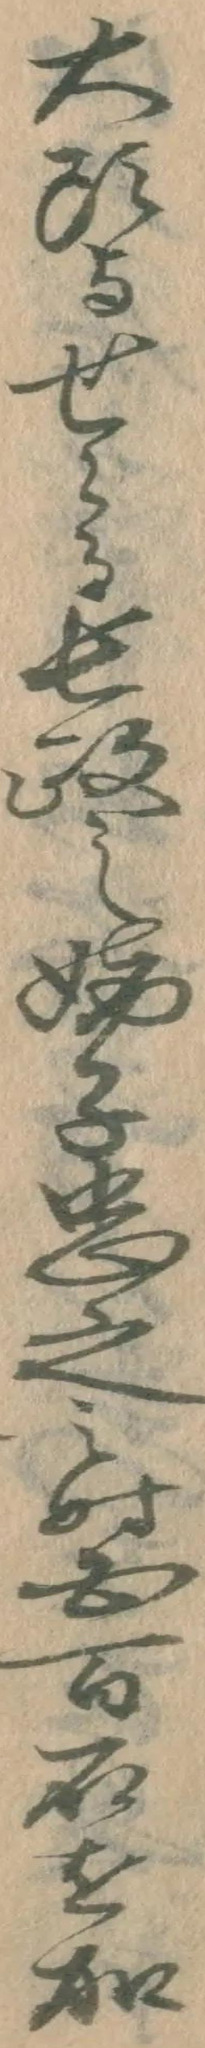大頭与せらる長政之嫡子忠之之時五百石を加
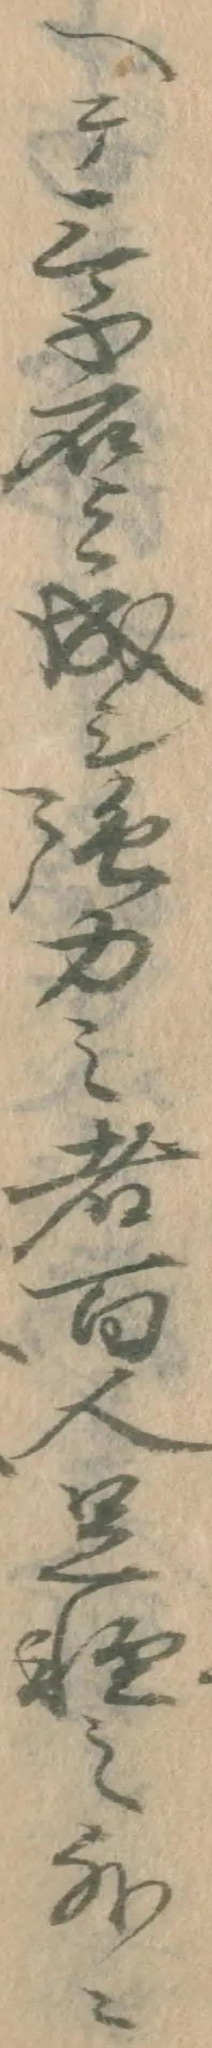へて三千石与成し強力之者百人足軽之外に
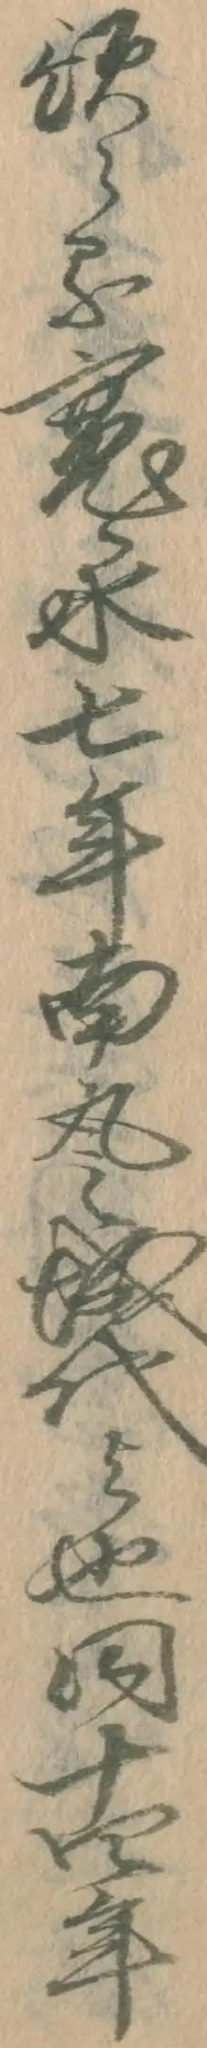預ら累寛永七年南丸之城代与也同十四年
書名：切支丹御退治記 49巻. [8]
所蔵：国立国会図書館 National Diet Library, JAPAN
